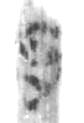𠭁
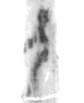北
